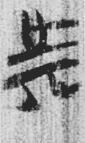者
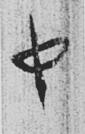中（仲）
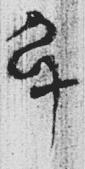弓
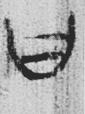曰
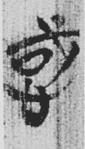惑（赦）
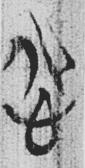○（過）
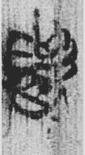○（與）
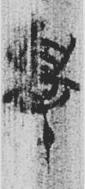辠（罪）
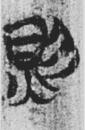則
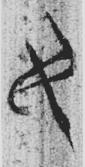民
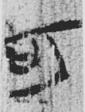可
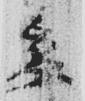○（後）
